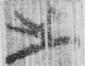之
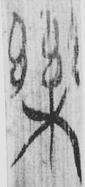樂
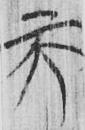而
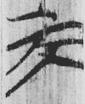天
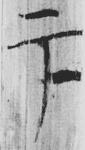下
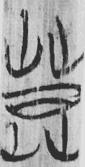莫
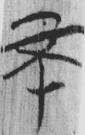不
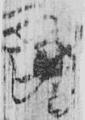語
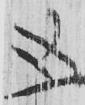之〈先〉
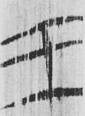王
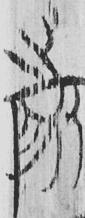之所
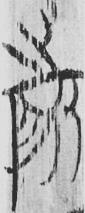所
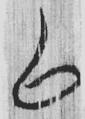㠯（以）
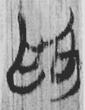爲
